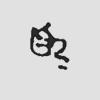爲
